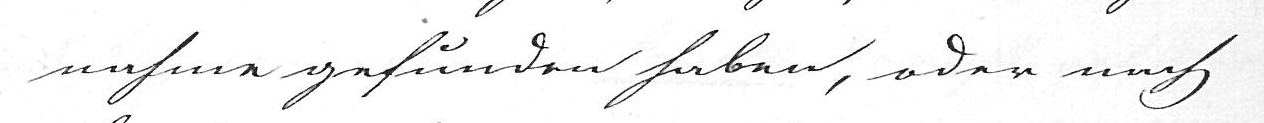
nehmer gefunden haben, oder nach
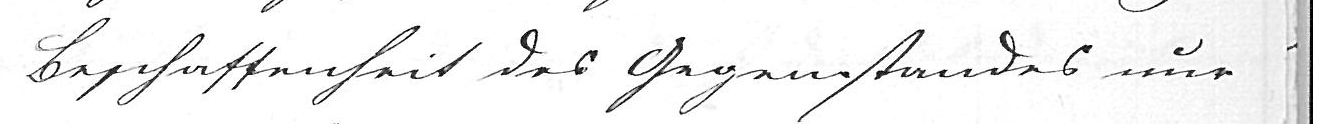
Beschaffenheit des Gegenstandes nur
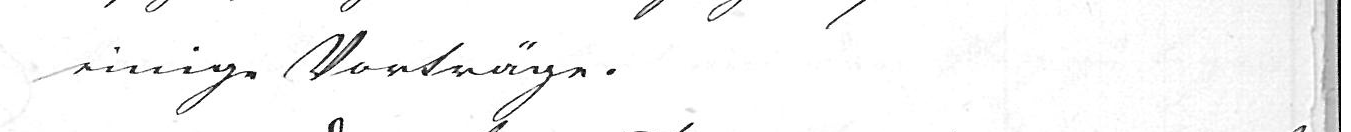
einige Vorträge.
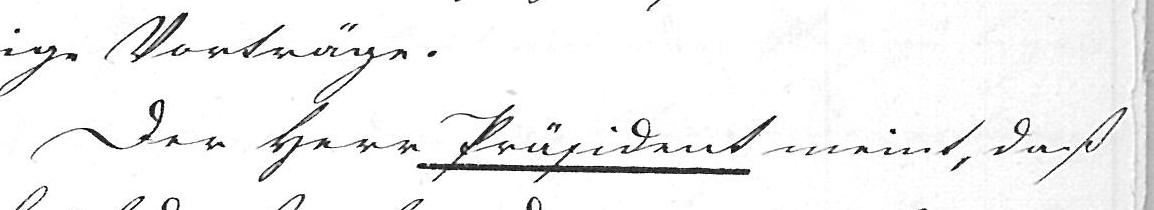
Der Herr Präsident meint, daß
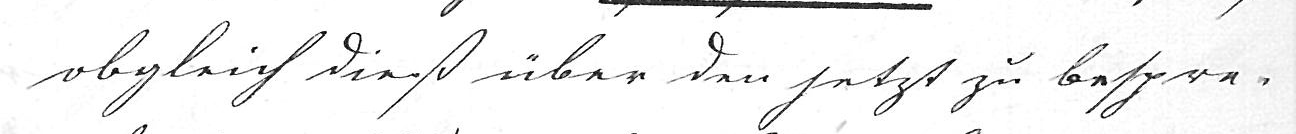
obgleich dieß über den jetzt zu bespre-
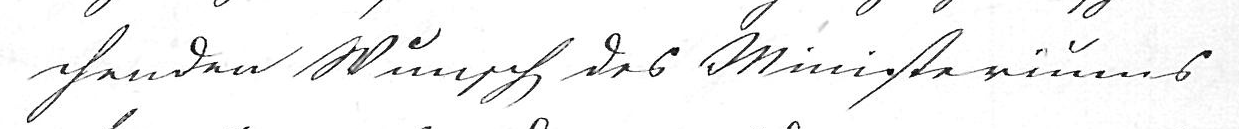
chenden Wunsch des Ministeriums
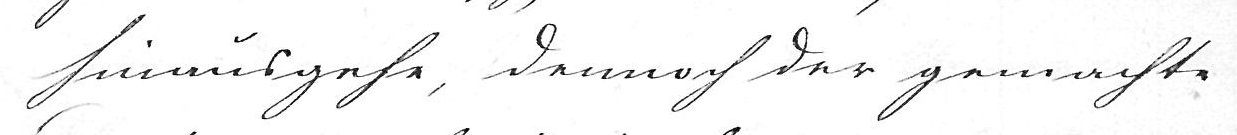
hinausgehe, dennoch der gemachte
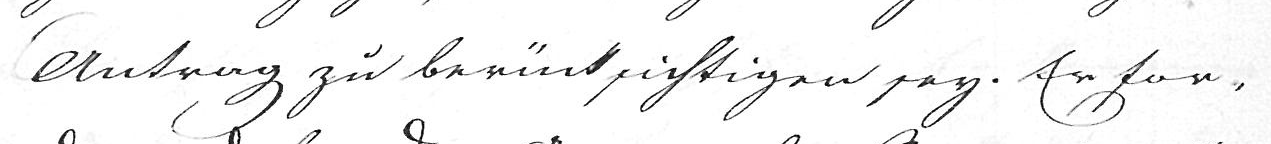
Antrag zu berücksichtigen sey. Er for-
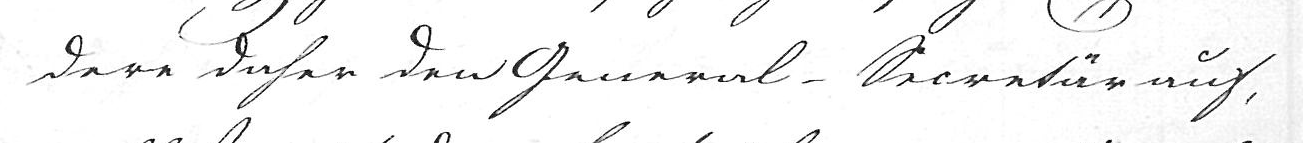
dere daher den General-Secretär auf,
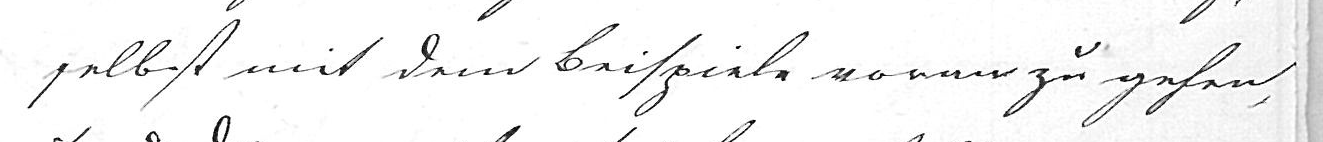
selbst mit dem Beispiels voranzugehen,
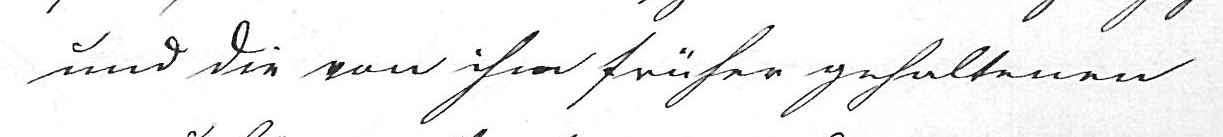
und die von ihm früher gehaltenen
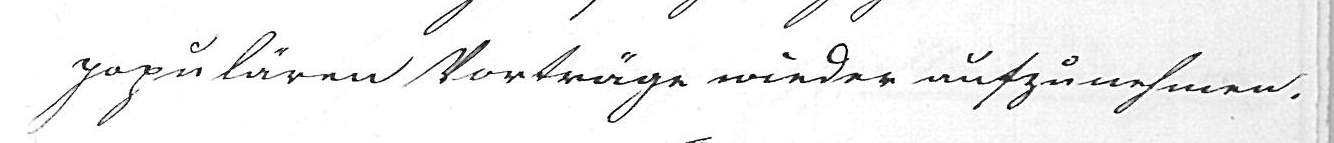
populären Vorträge wieder aufzunehmen.
